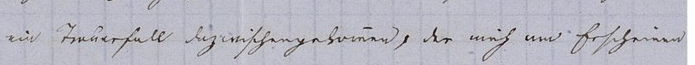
ein Trauerfall dazwischengekommen, der mich am Erscheinen
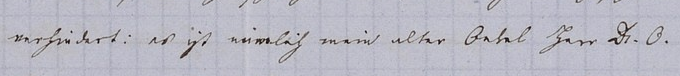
verhindert: es ist nämlich mein alter Onkel Herr Dr. O.
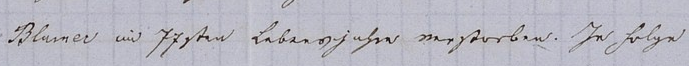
Blumer im 77sten Lebensjahre verstorben. In Folge
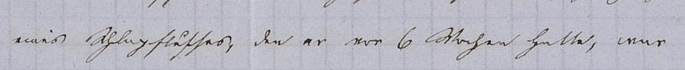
eines Schlagflusses, den er vor 6 Wochen hatte, war
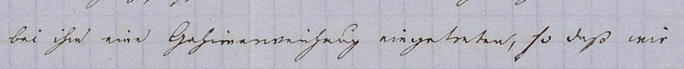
bei ihm eine Gehirnerweichung eingetreten, so daß wir
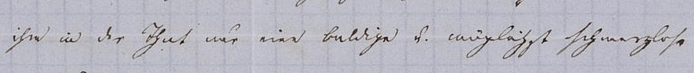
ihm in der That nur eine baldige u. möglichst schmerzlose
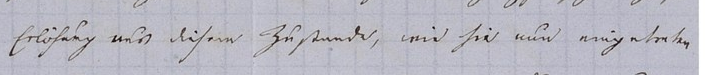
Erlösung aus diesem Zustande, wie sie nun eingetreten
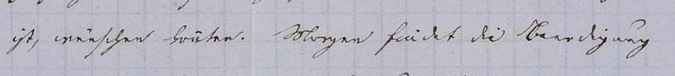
ist, wünschen konnten. Morgen findet die Beerdigung
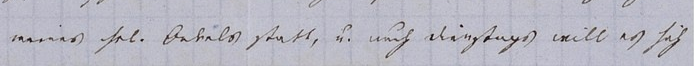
meines sel. Onkels statt, u. auch Dienstags will es sich
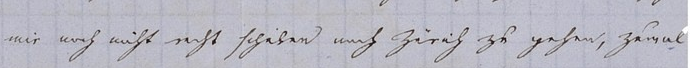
mir noch nicht recht schiken nach Zürich zu gehen, zumal
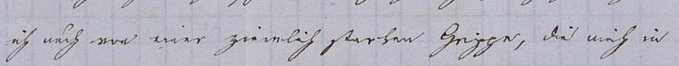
ich auch von einer ziemlich starken Grippe, die mich in
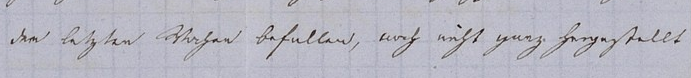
den letzten Wochen befallen, noch nicht ganz hergestellt
